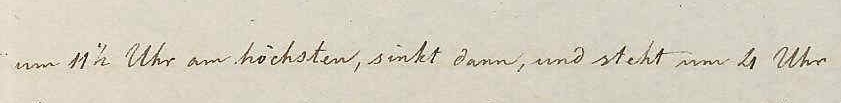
um 11½ Uhr am höchsten, sinkt dann, und steht um 4 Uhr
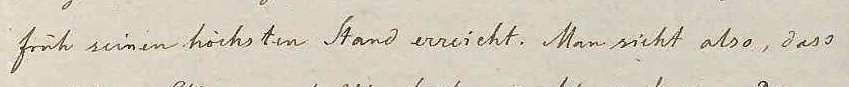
früh seinen höchsten Stand erreicht. Man sieht also, dass
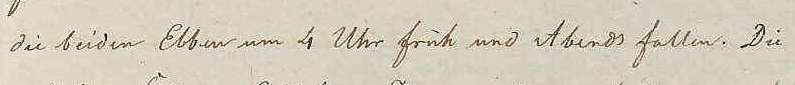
die beiden Ebben um 4 Uhr früh und Abends fallen. Die
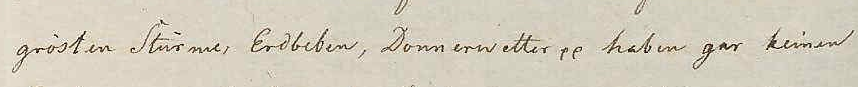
grösten Stürme, Erdbeben, Donnerwetter pp haben gar keinen
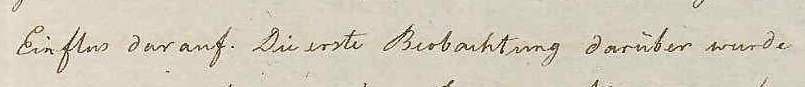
Einflus darauf. Die erste Beobachtung darüber wurde
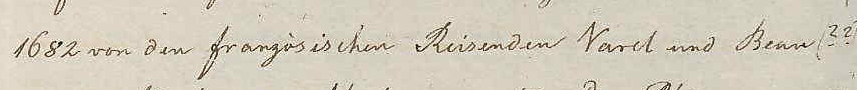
1682 von den französischen Reisenden Varel und Beau
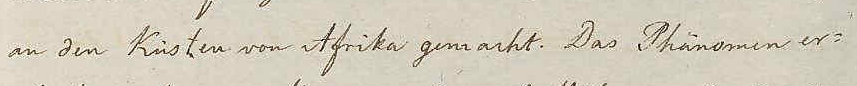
an den Küsten von Afrika gemacht. Das Phänomen er-
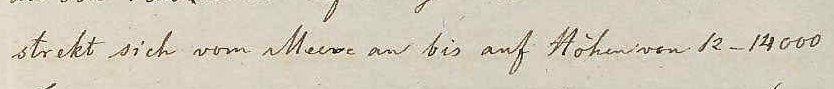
strekt sich vom Meere an bis auf Höhen von 12–14000
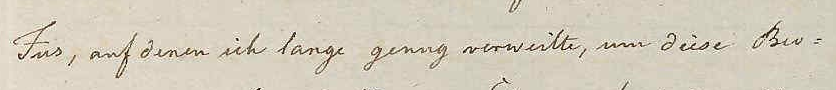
Fus, auf denen ich lange genug verweilte, um diese Beo-
